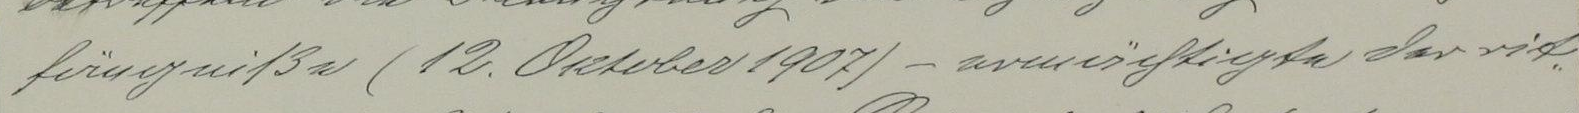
fängniße (12. Oktober 1907) - ermächtigte der rit-
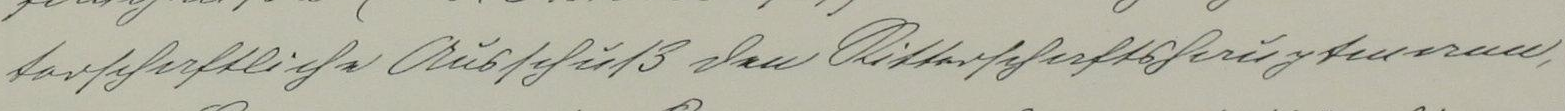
terschaftliche Ausschuß den Ritterschaftshauptmann,
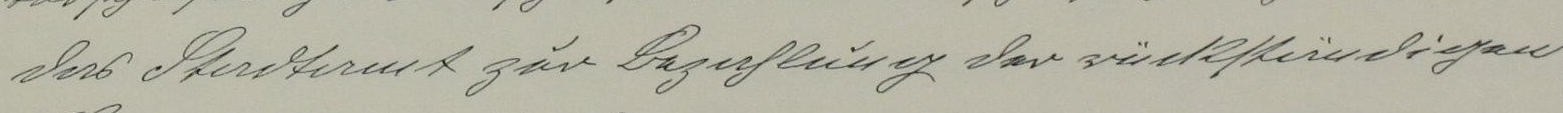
das Stadtamt zur Bezahlung der rückständigen
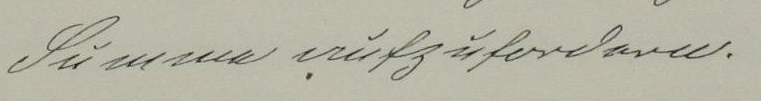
Summen aufzufordern.
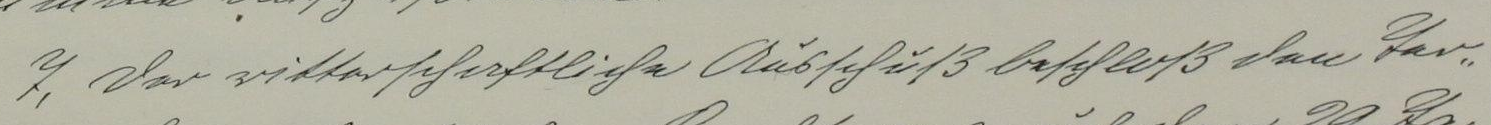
7. Der ritterschaftliche Ausschuß beschloß den Ter-
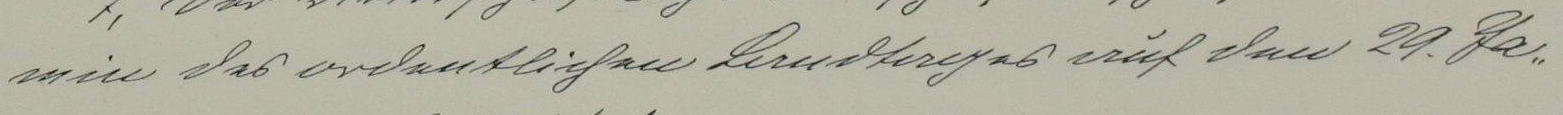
min des ordentlichen Landtages auf den 29. Ja-
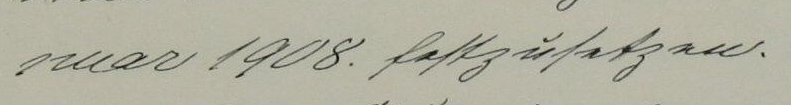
nuar 1908. festzusetzen.
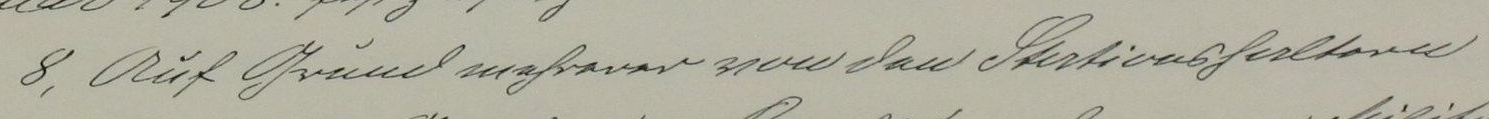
8. Auf Grund mehrerer von den Stationshaltern
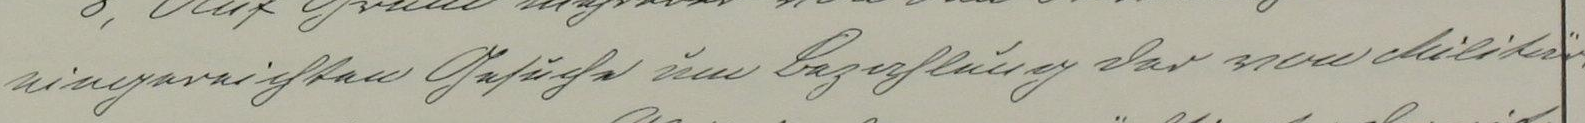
eingereichten Gesuche um Bezahlung der von Militär-
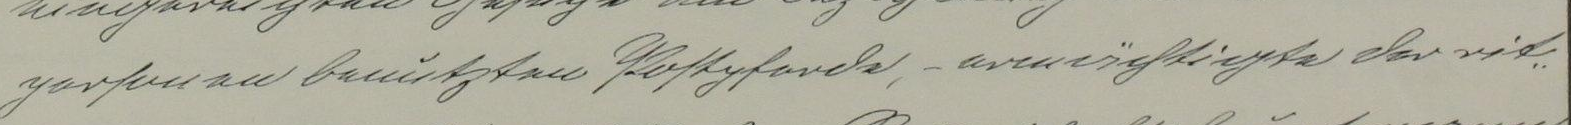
personen benutzten Postpferde, - ermächtigte der rit-
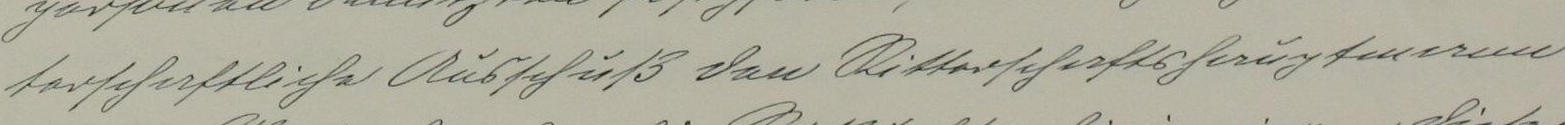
terschaftliche Ausschuß den Ritterschaftshauptmann
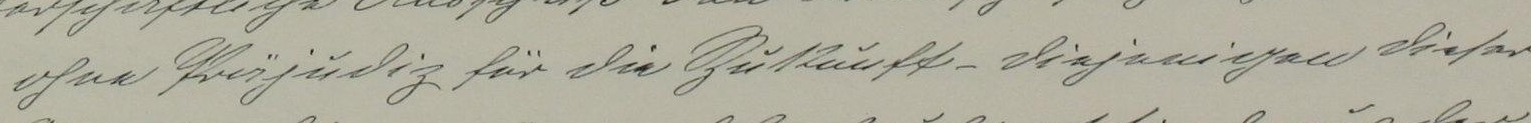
– ohne Präjudiz für die Zukunft – diejenigen dieser
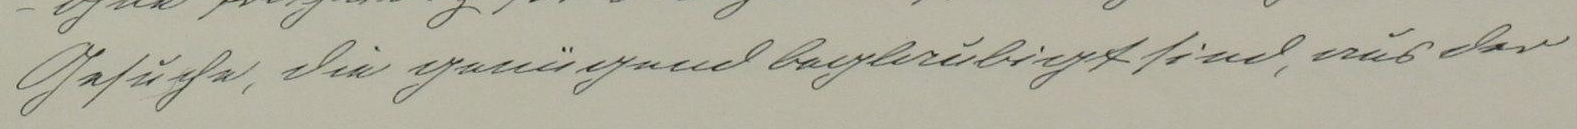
Gesuche, die genügend beglaubigt sind, aus der
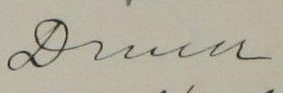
Druck
